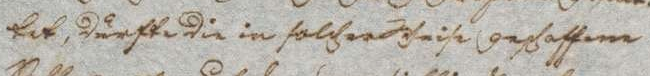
tet, dürfte die in solcher Weise geschaffene
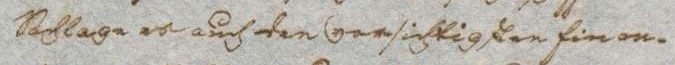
Sachlage es auch den vorsichtigsten Finan-
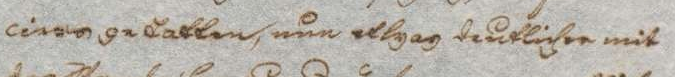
ciers gestatten, nun etwas deutlicher mit
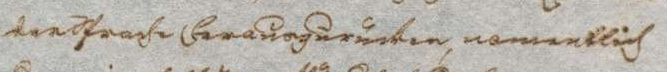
der Sprache herauszurücken, namentlich
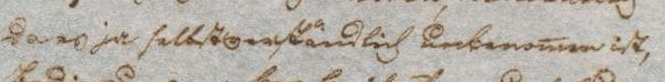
da es ja selbstverständlich unbenommen ist,
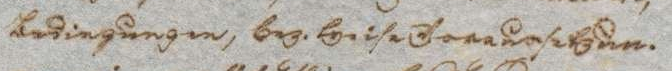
Bedingungen, bez.weise Voraussetzun-
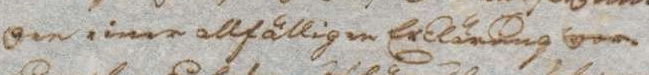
gen einer allfälligen Erklärung vor-
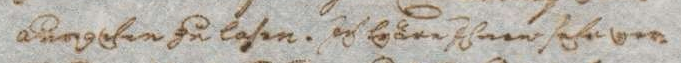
ausgehen zu lassen. Ich wäre Ihnen sehr ver-
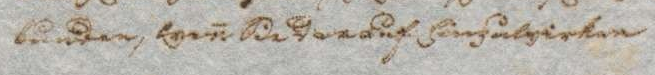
bunden, wenn Sie darauf hinzuwirken
